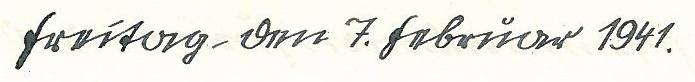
Freitag, den 7. Februar 1941.
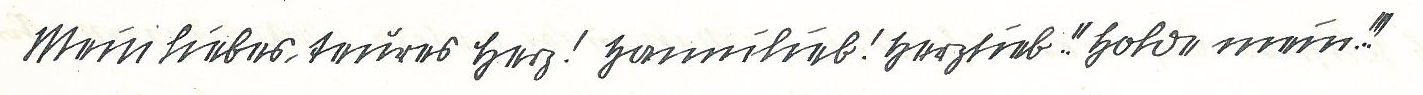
Mein liebes, teures Herz! lieb! Herzlieb!! Holde mein!!!
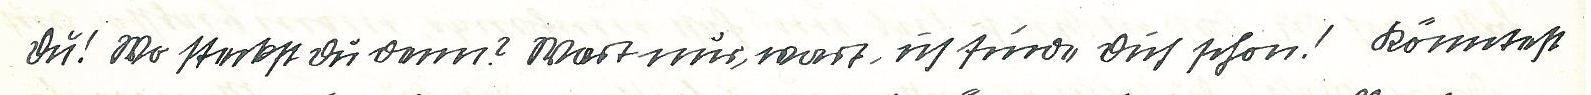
Du! Wo steckst Du denn? Wart nur, wart, ich finde Dich schon! Könntest
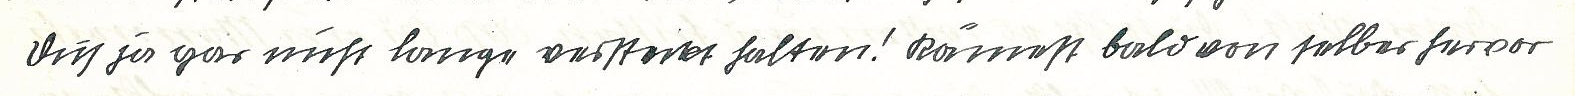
Dich ja gar nicht lange versteckt halten! Kämst bald von selber hervor
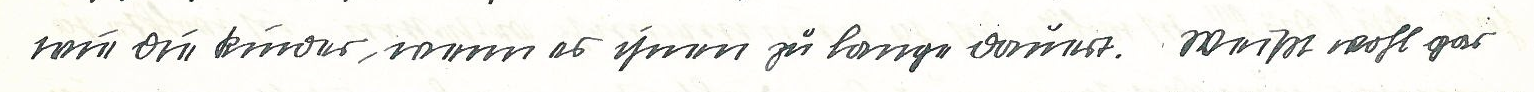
wie die Kinder, wenn es ihnen zu lange dauert. Weißt wohl gar
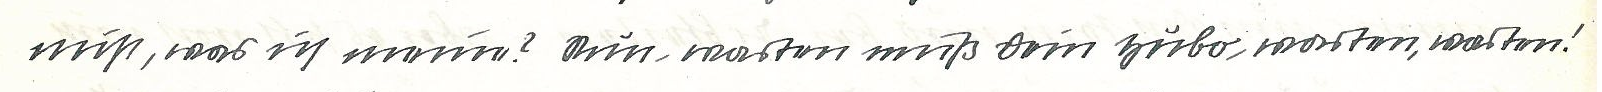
nicht, was ich meine? Nun, warten muß Dein Hubo, warten, warten!
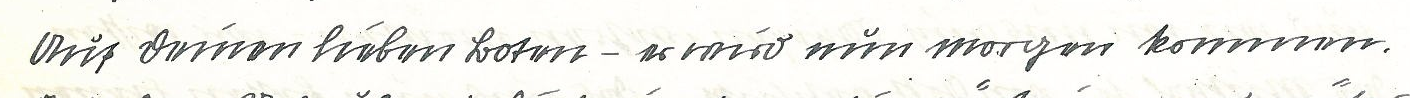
Auf Deinen lieben Boten – er wird nun morgen kommen.
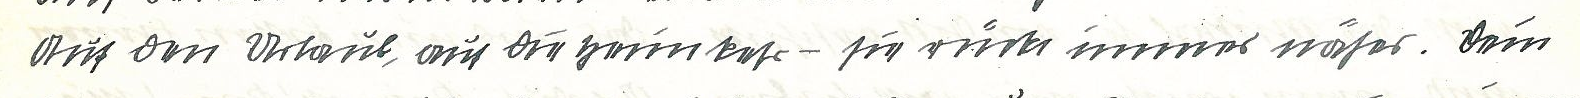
Auf den Urlaub, auf die Heimkehr – sie rückt immer näher. Dein
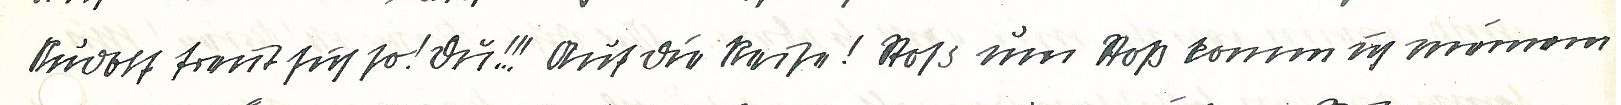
Rudolf freut sich so! Du!!! Auf die Reise! Stoß um Stoß komm ich meinem
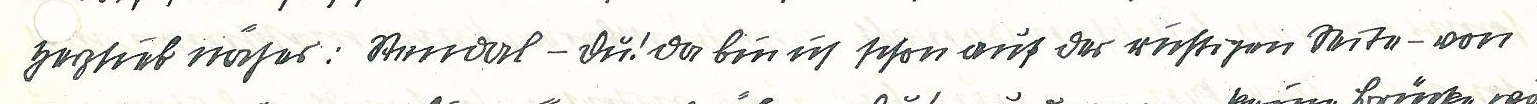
Herzlieb näher: Stendal – Du! da bin ich schon auf der richtigen Seite – von
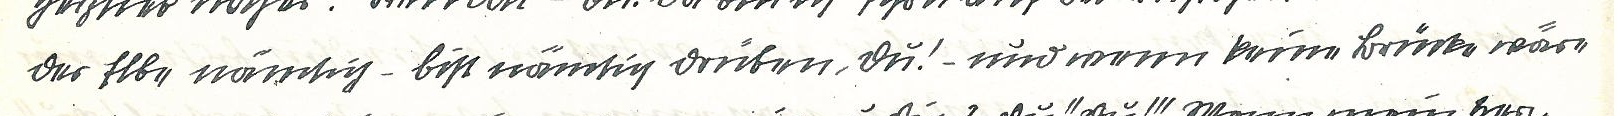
der Elbe nämlich – bist nämlich drüben, Du! – und wenn keine Brücke wäre
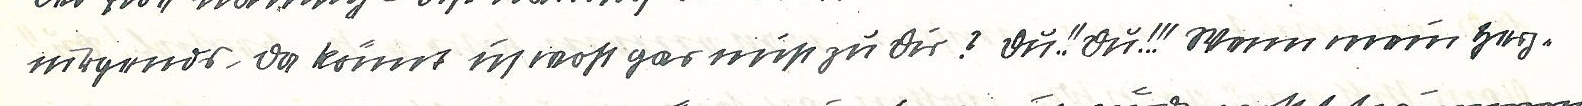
nirgends, da könnt ich wohl gar nicht zu Dir? Du!! Du!!! Wenn mein Her¬
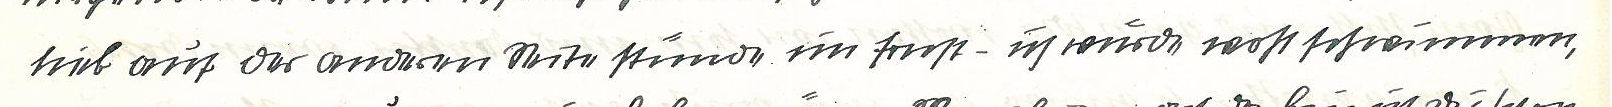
zlieb auf der anderen Seite stünde im Ernst – ich würde noch schwimmen,
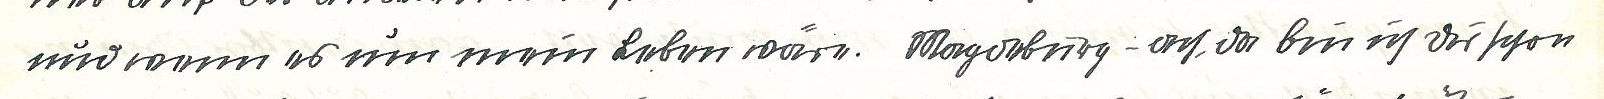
und wenn es um mein Leben wäre. Magdeburg – ach, da bin ich Dir schon
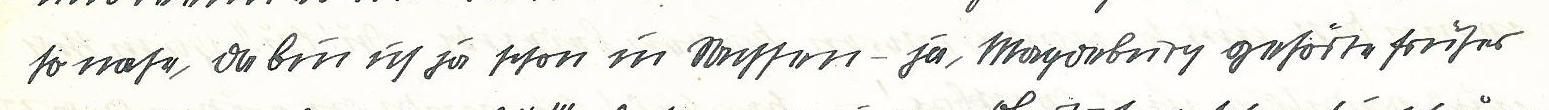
so nahe, da bin ich ja schon in Sachsen – ja, Magdeburg gehörte früher
